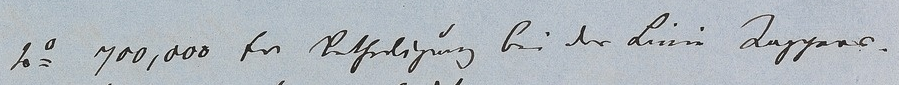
4o 700,000 Fr Betheiligung bei der Linie Rappers-
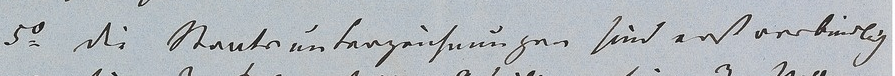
5o die Staatsunterzeichungen sind erst verbindlich
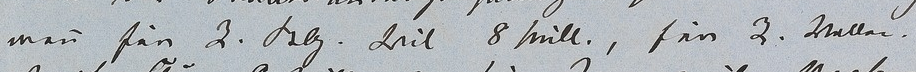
wenn für R–St G–Wil 8 Mill., für R–Wallen-
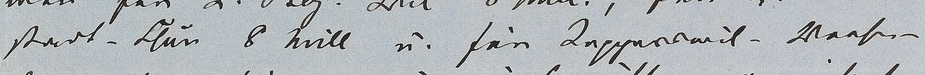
stadt–Chur 8 Mill u. für Rapperswil–Weesen–
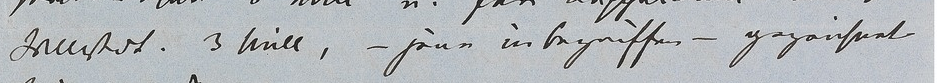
Wllstdt. 3 Mill, – jene inbegriffen – gezeichnet
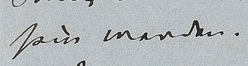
sein werden.
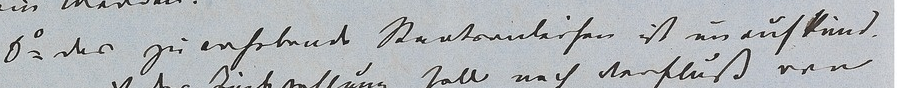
6o das zu erhebende Staatsanleihen ist unaufkünd-
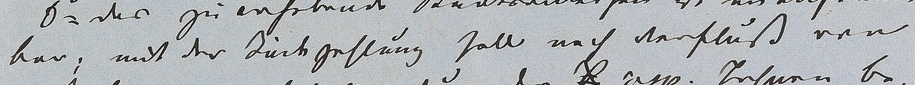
bar; mit der Rückzahlung soll nach Verfluß von
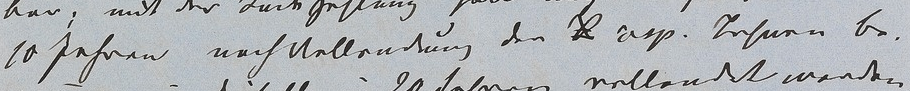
10 Jahren nach Vollendung der ... resp. Bahnen be-
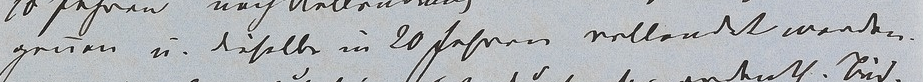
gonnen u. dieselbe in 20 Jahren vollendet werden.
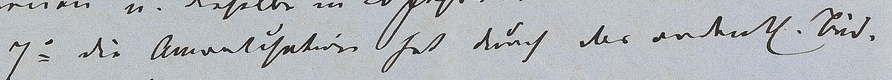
7o die Amortisation hat durch das ordentl. Bud-
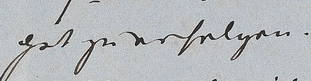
get zu erfolgen.
